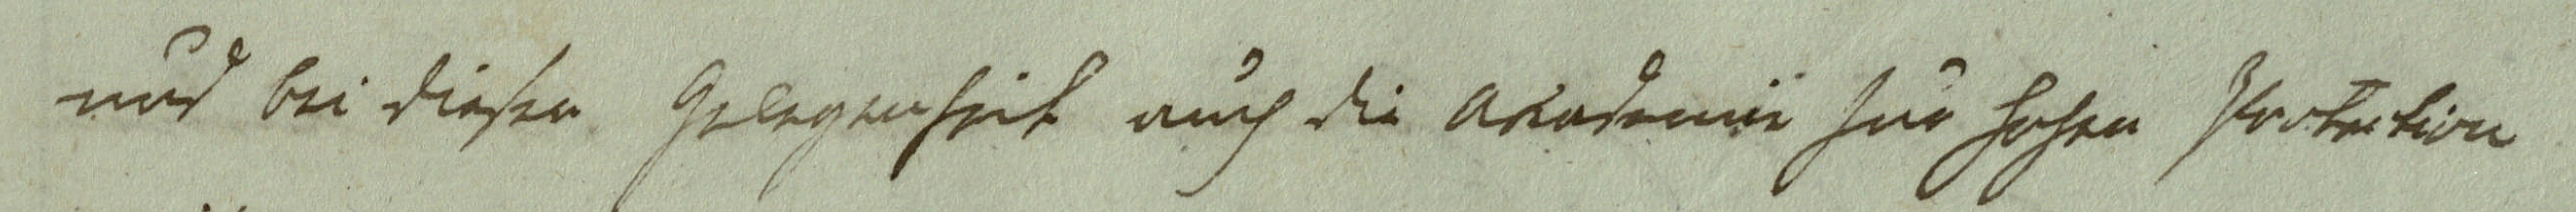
und bei dieser Gelegenheit auch die Akademie zur hohen Protection
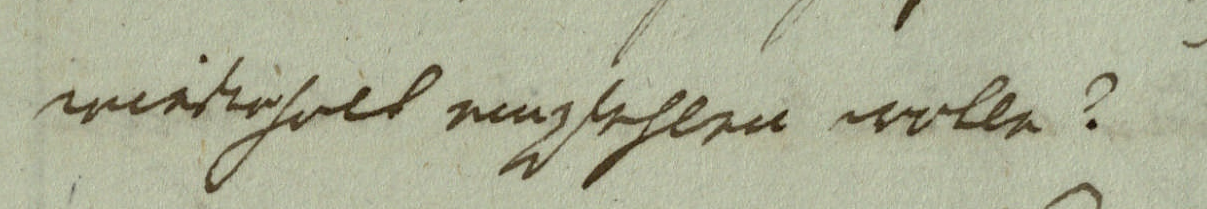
wiederholt empfehlen wolle?
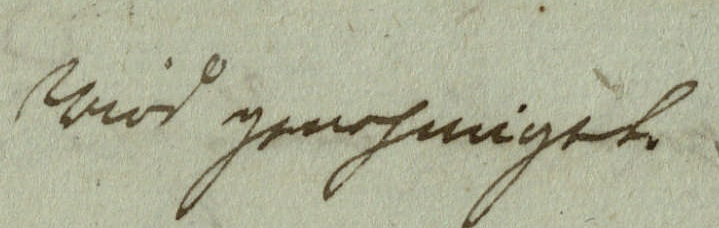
Wird genehmiget.
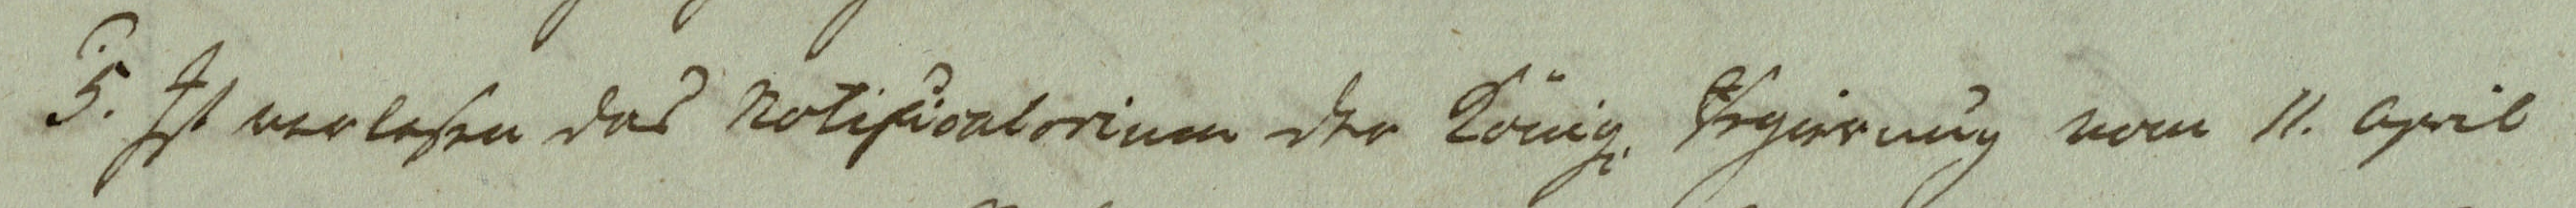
5. Ist verlesen das Notificatorium der Königl. Regierung vom 11. April
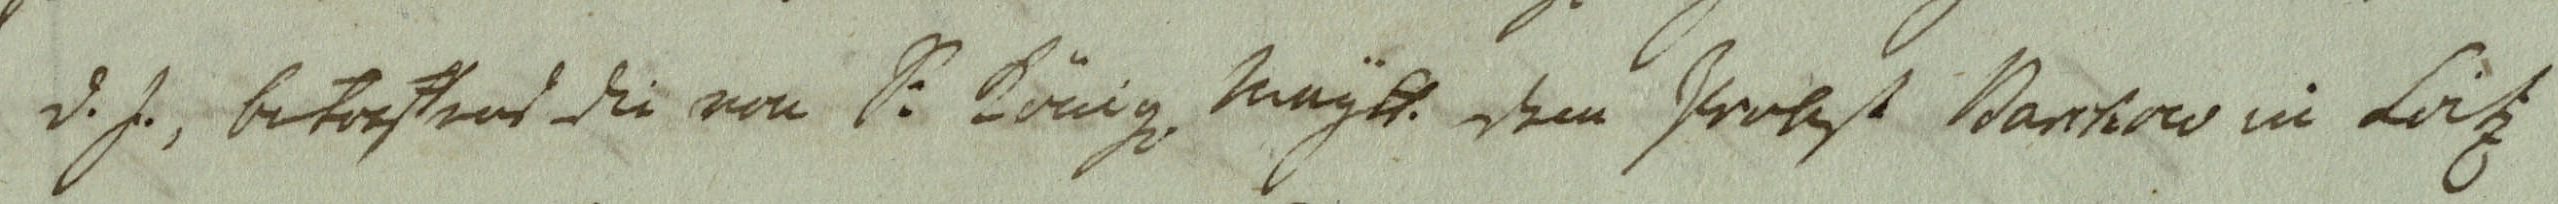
d. J., betreffend die von Sr. Königl. Maÿtt. dem Probst Barckow in Loitz
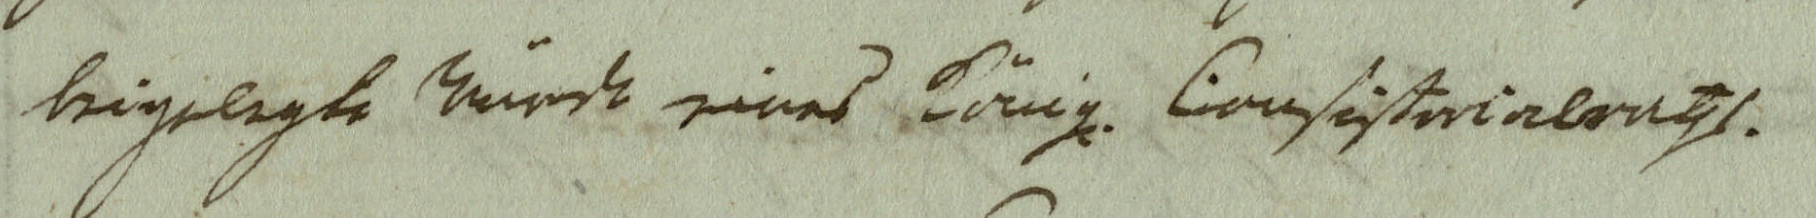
beigelegte Würde eines Königl. Consistorialraths.
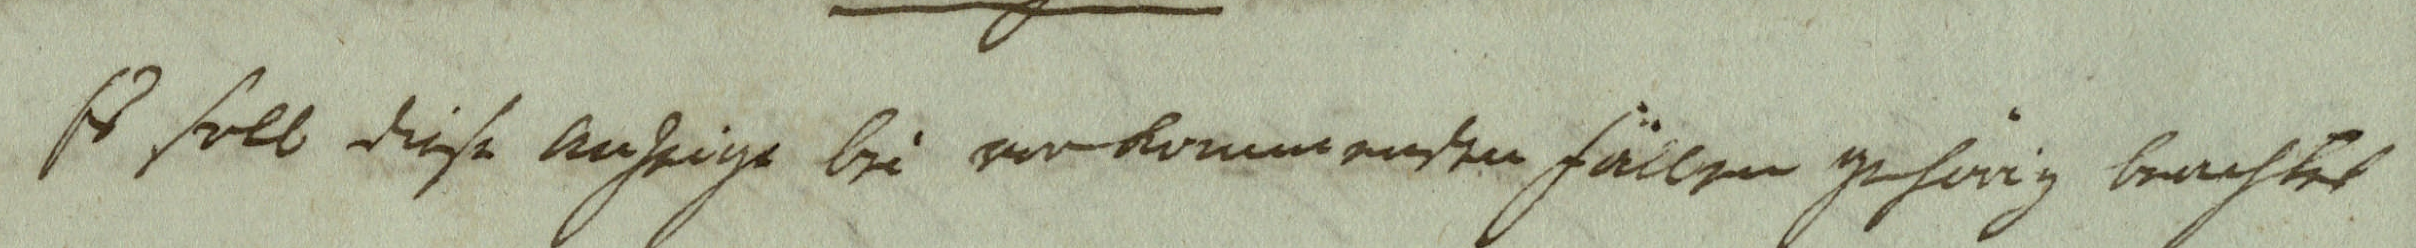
Es soll diese Anzeige bei vorkommenden Fällen gehörig beachtet
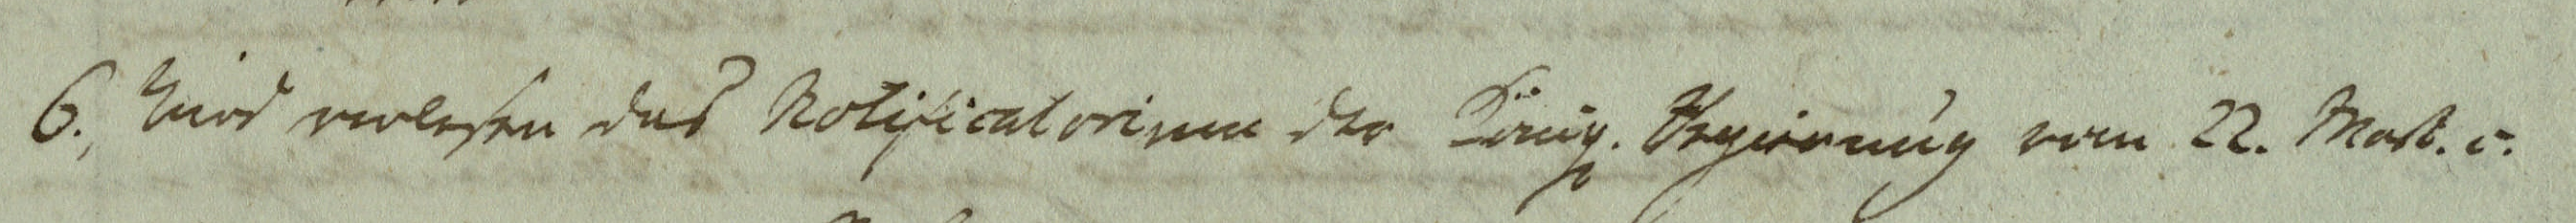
6. Wird verlesen das Notificatorium der Königl. Regierung vom 22. Mart. c.
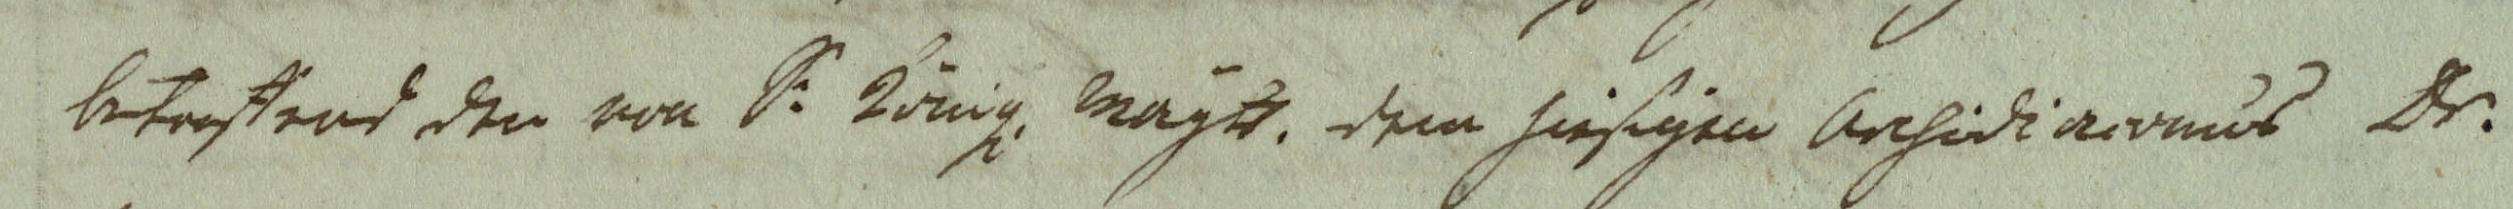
betreffend den von Sr. Königl. Maÿtt. dem hiesigen Archidiaconus Dr.
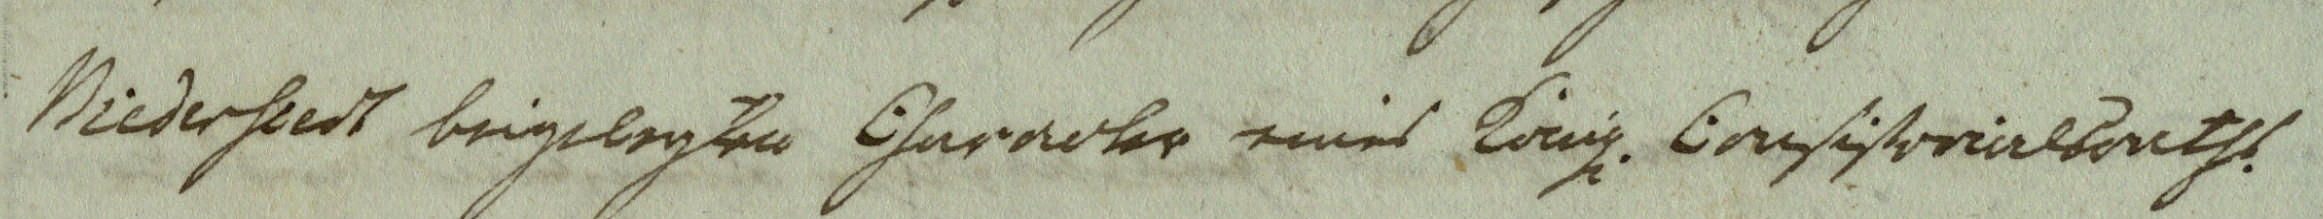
Biederstedt beigelegten Charakter eines Königl. Consistorialraths.
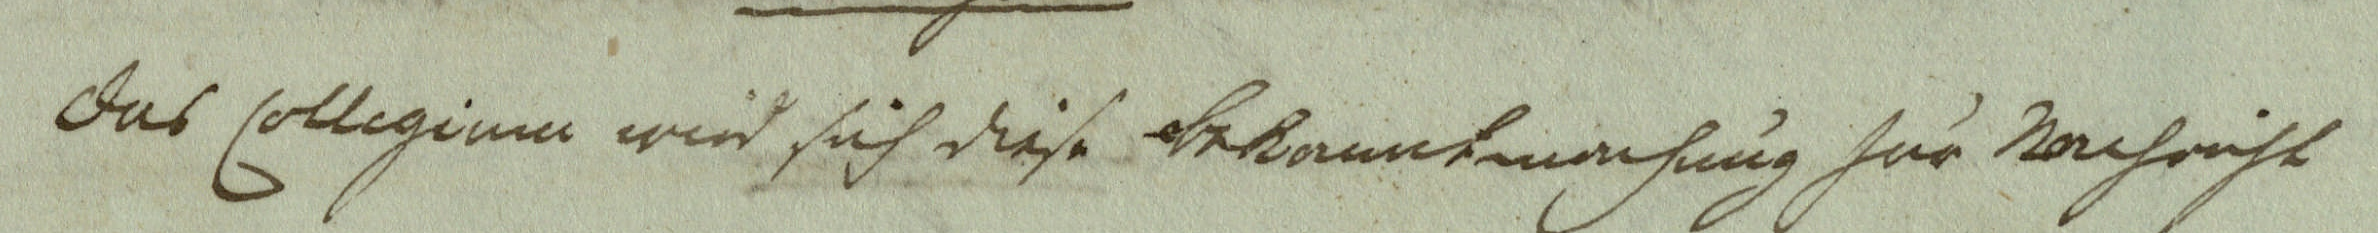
Das Collegium wird sich diese Bekanntmachung zur Nachricht
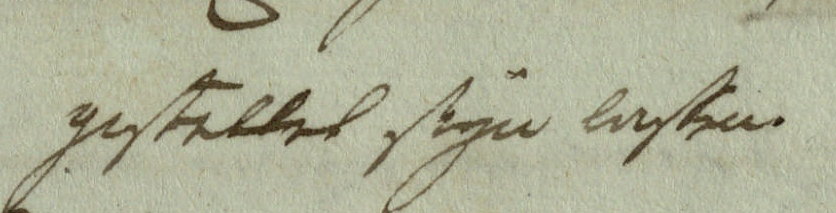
gestellet seÿn lassen.
